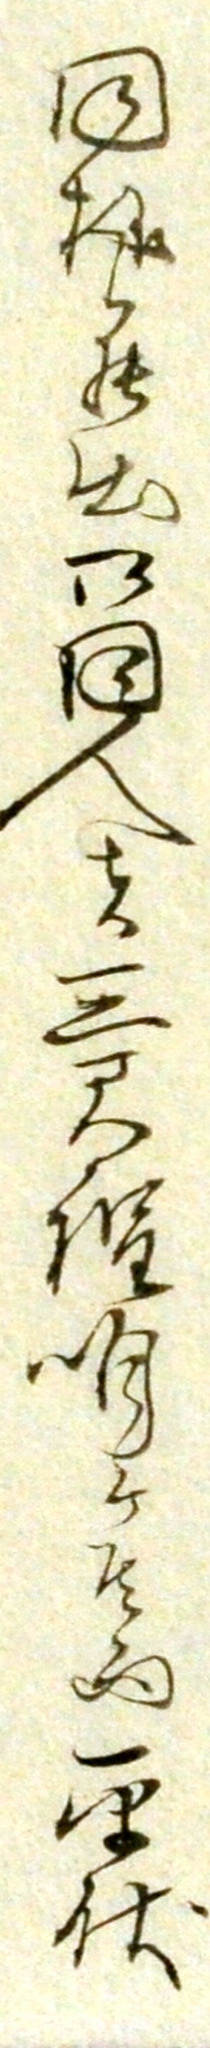同様罷出御同人は三尺程明ケ候而平伏
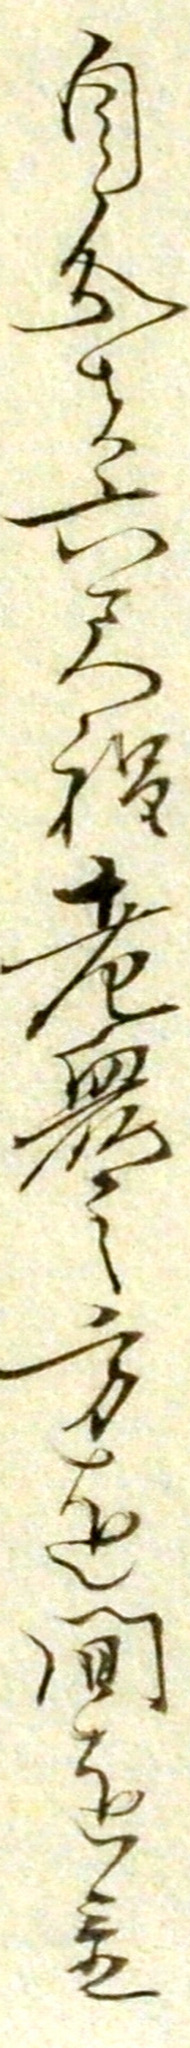自分は六尺程老衆之方を間を置
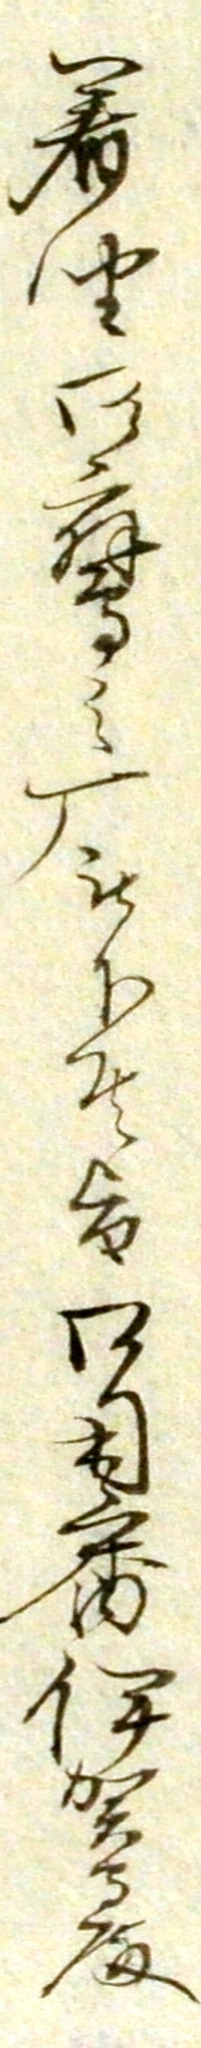着坐御鷹之雁被下候旨御用番伊賀守殿
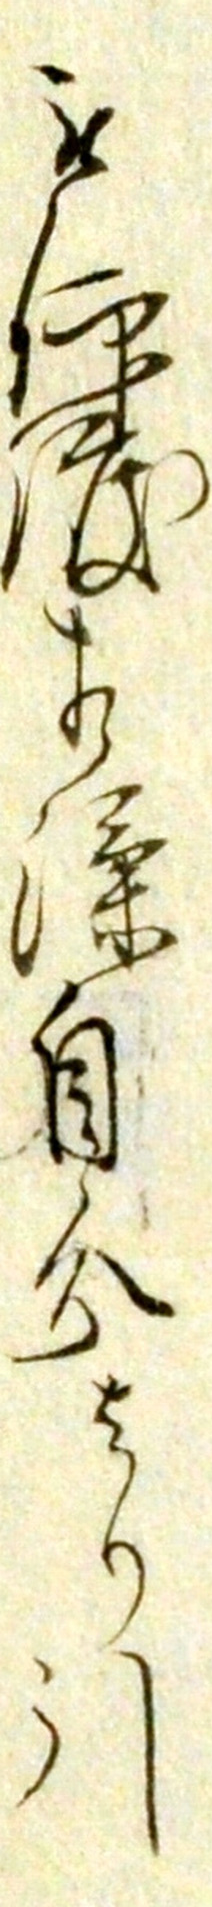被仰渡相済自分より引

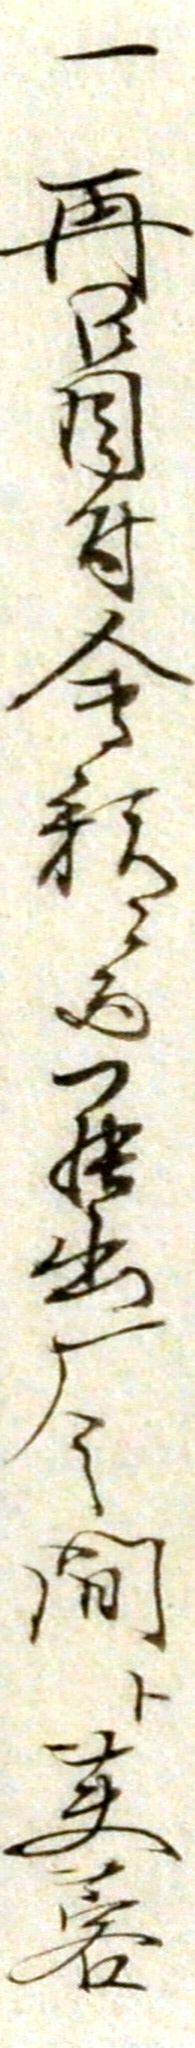一再御目付会釈ニ而罷出雁之間ト芙蓉
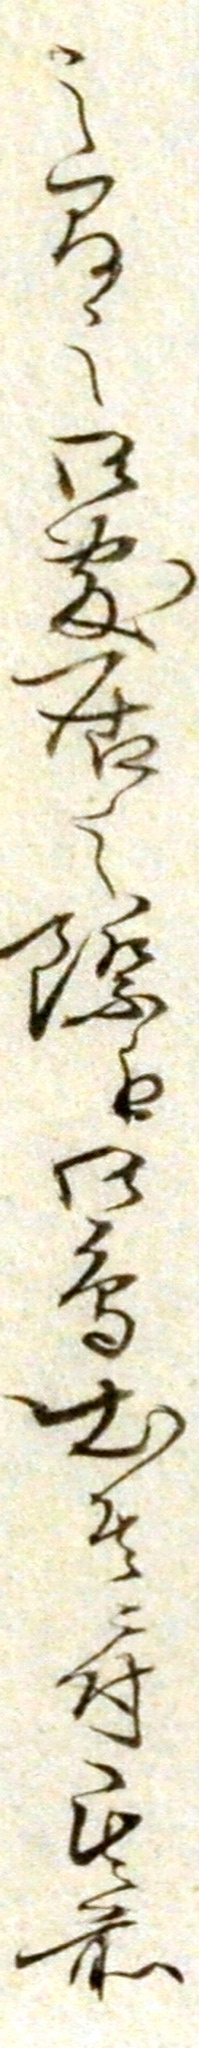之間之御敷居之際え御鳥出候ニ付其前
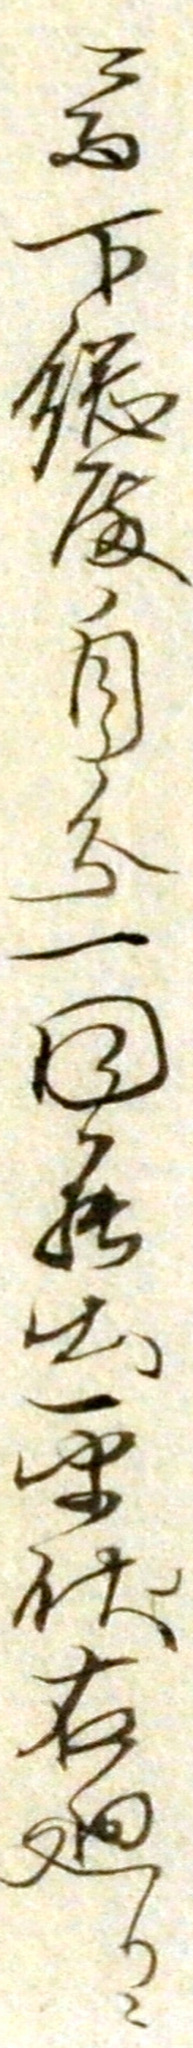ニ而下総殿自分一同罷出平伏右廻りニ
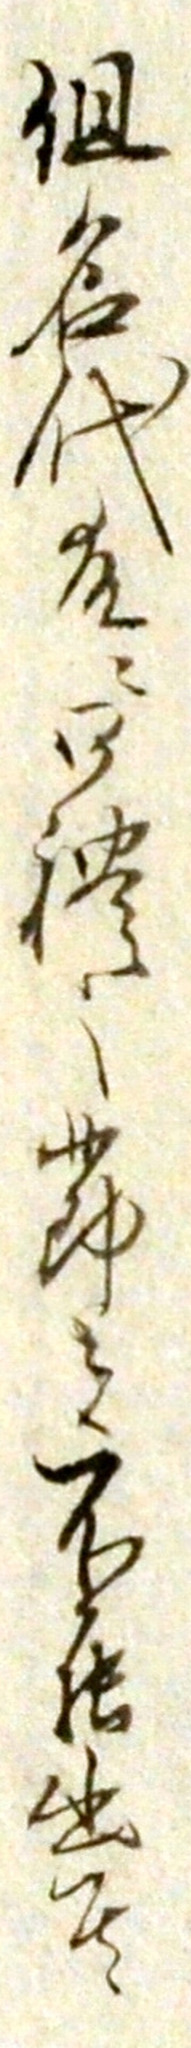但名代故ニ御礼之節は不罷出候
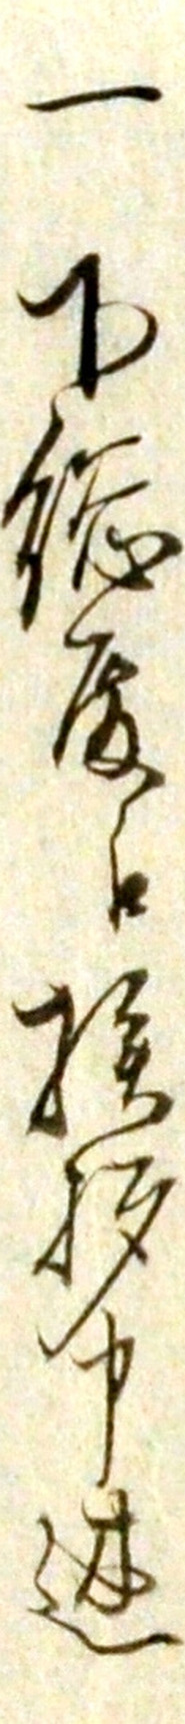一下総殿え挨拶申述
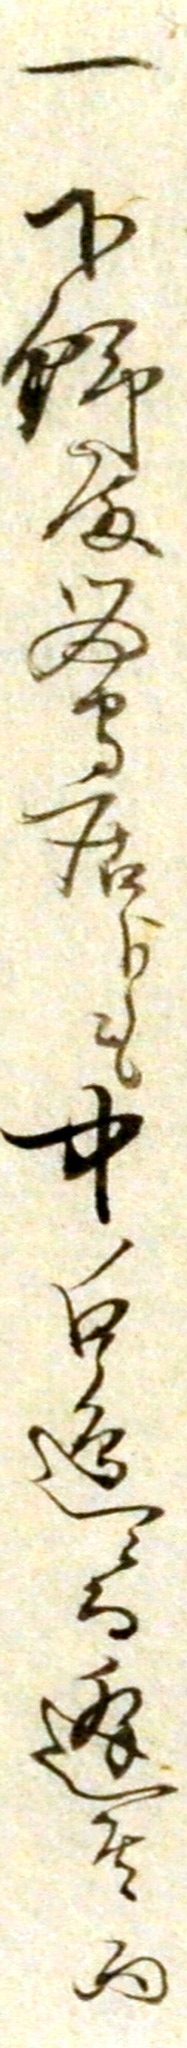一下野殿留守居えも中ノ口辺ニ而逢候而
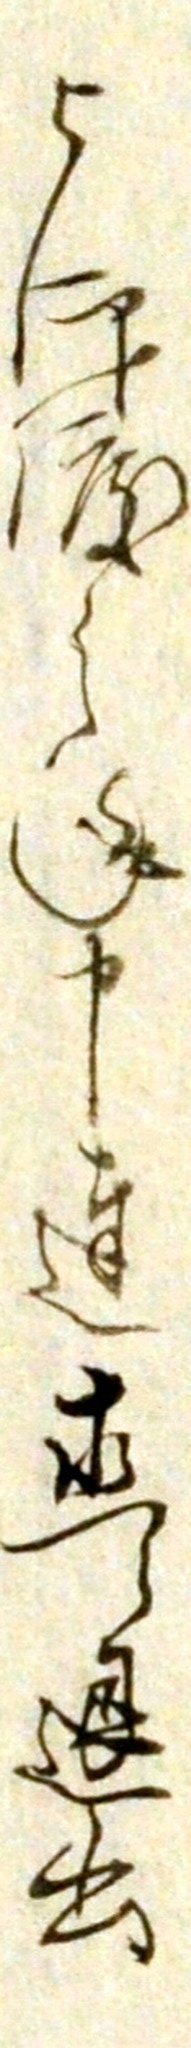被仰渡之趣申達直ニ退出
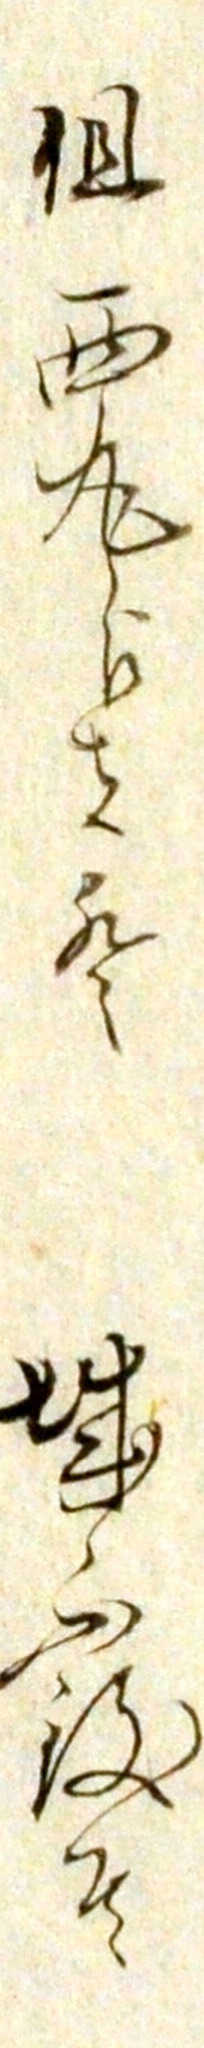但西丸えは登城不致候
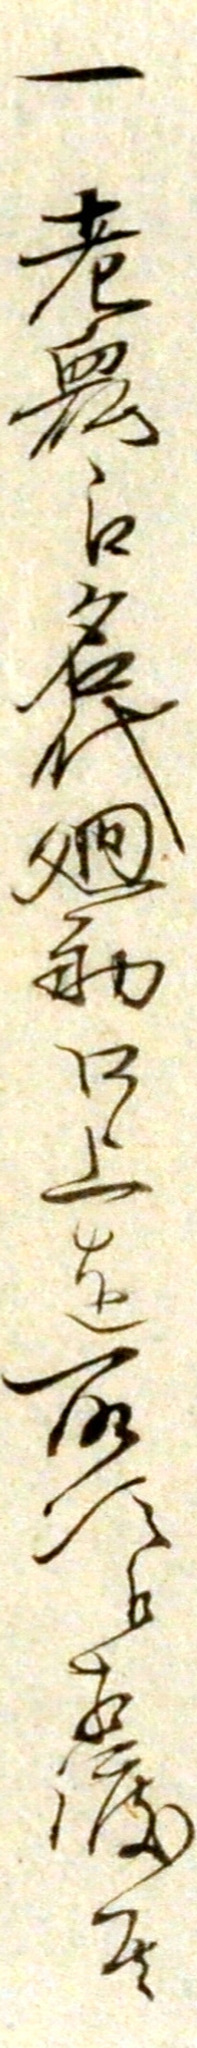一老衆え名代廻勤口上を取次え相渡候
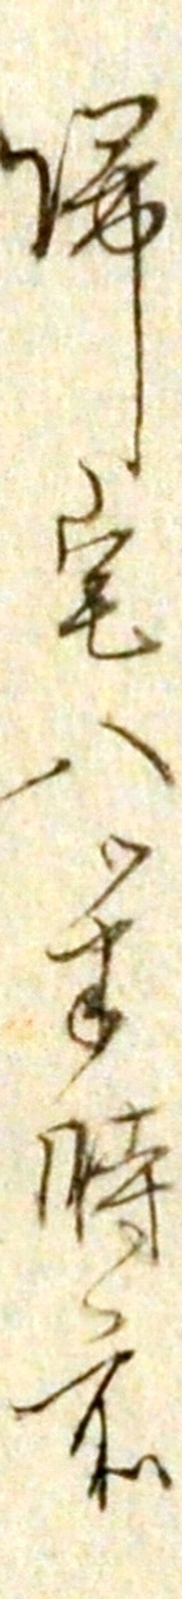帰宅八ツ半時前

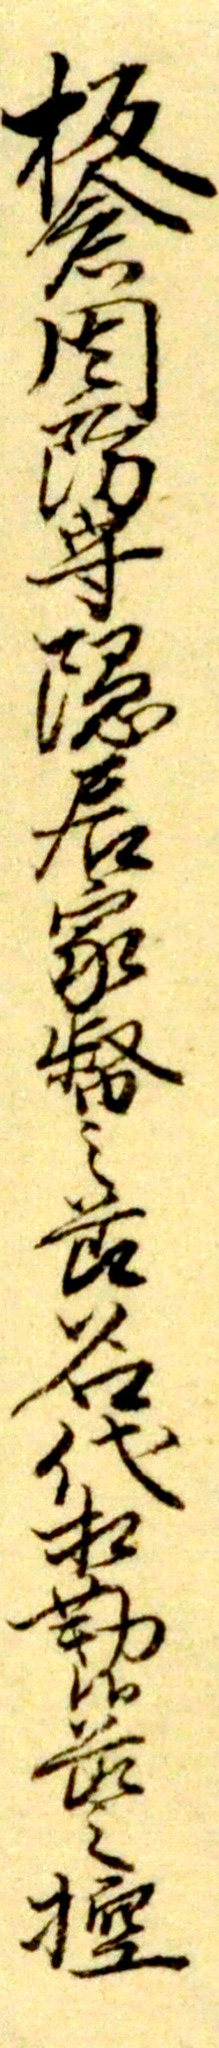板倉周防守隠居家督之節名代相勤候節之控

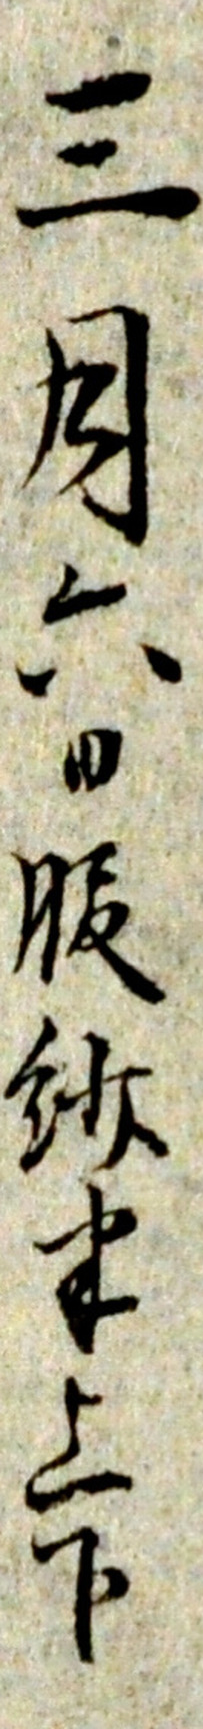三月六日服紗半上下
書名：諸名代相勤候節ノ留書外
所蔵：伊那市立高遠町図書館・合同会社AMANE
